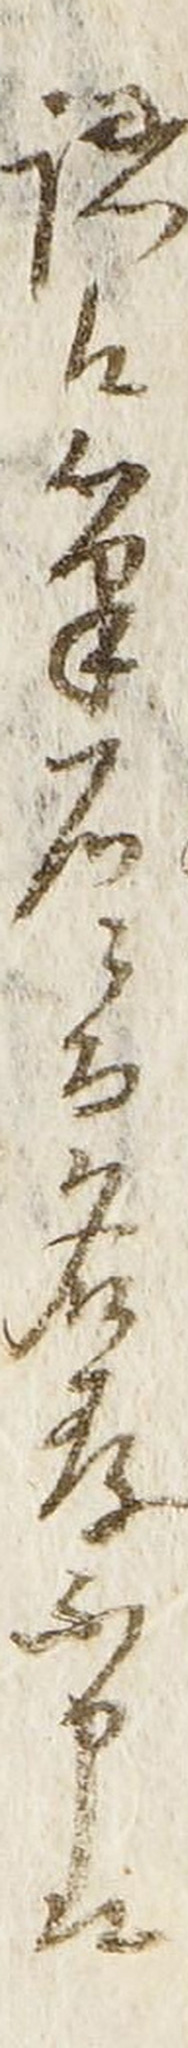認候筆石ニ而名存不申候
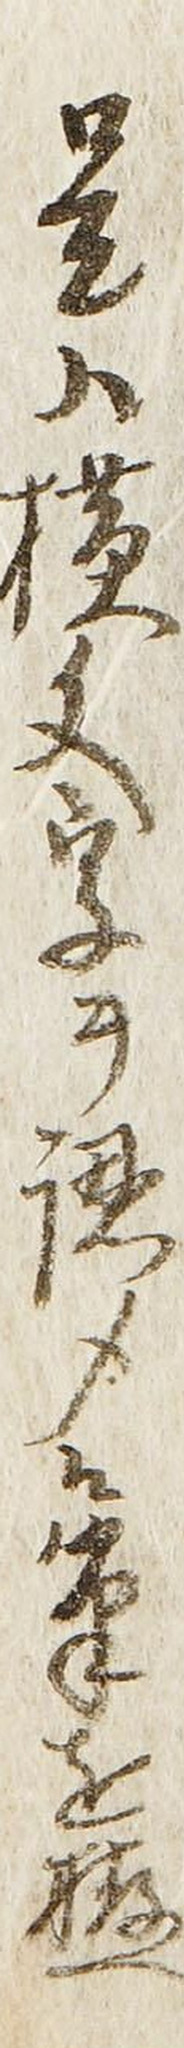是ハ横文字ヲ認メ候筆を拵へ
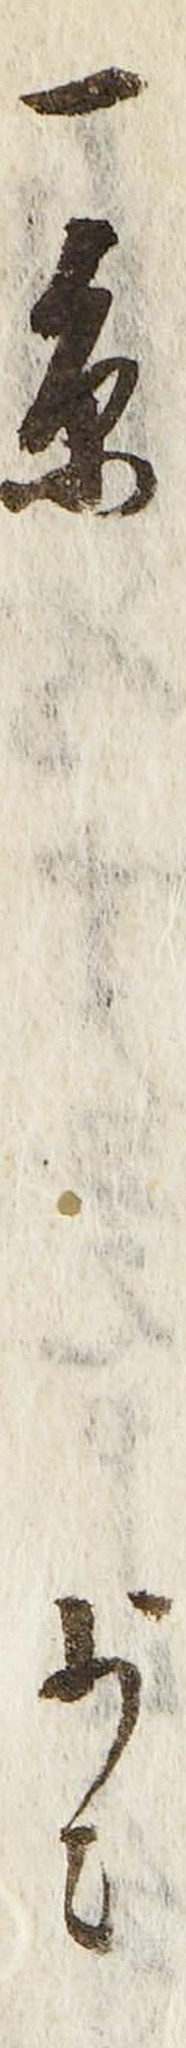一糸少々
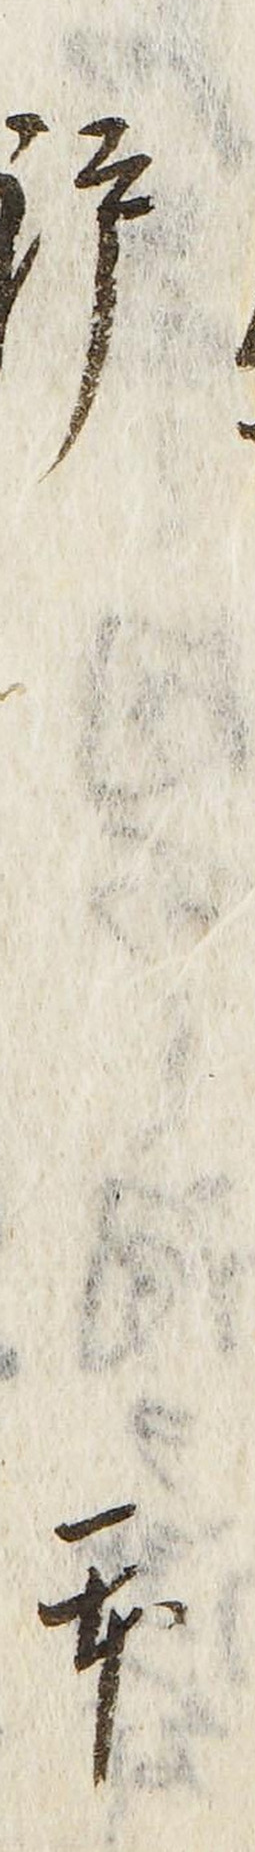鈩一本
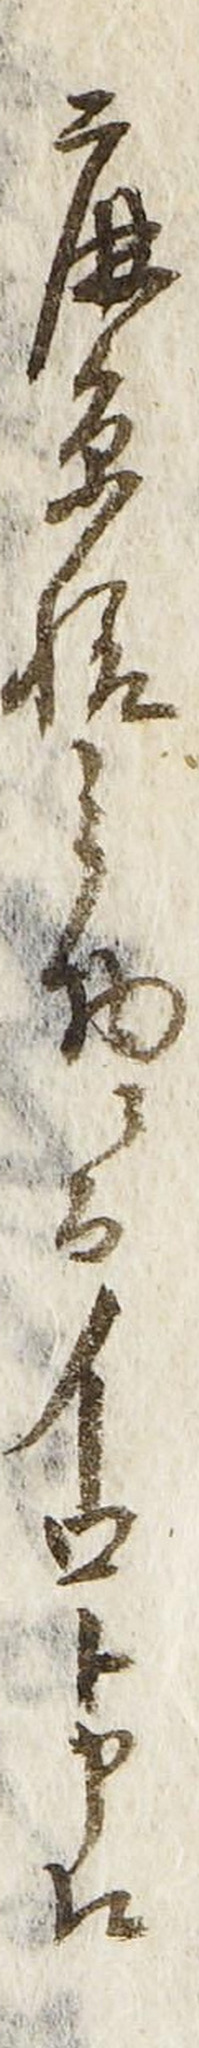麻糸様之物ニ而イロト申候
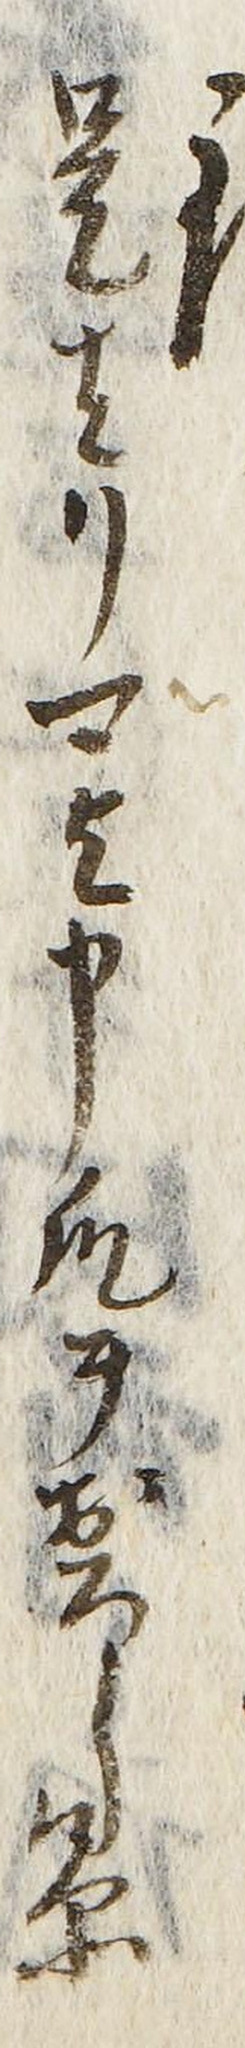是者リマと申爪ヲおろし候品
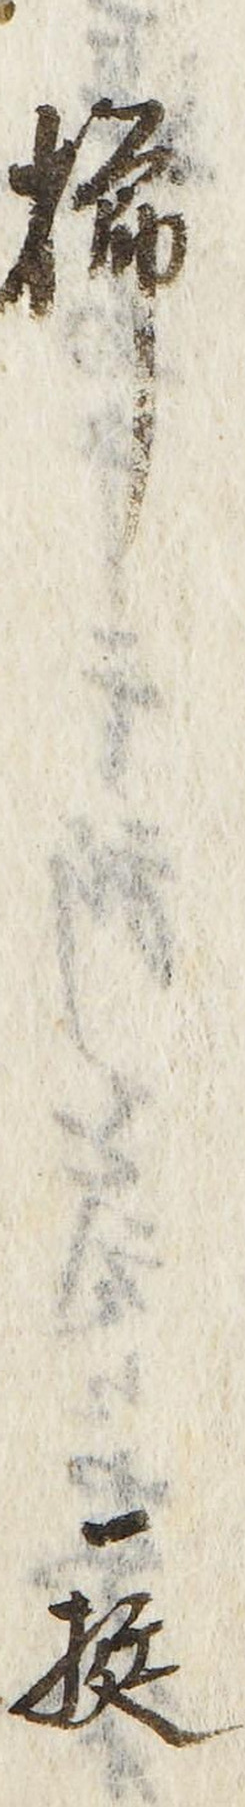櫛一挺
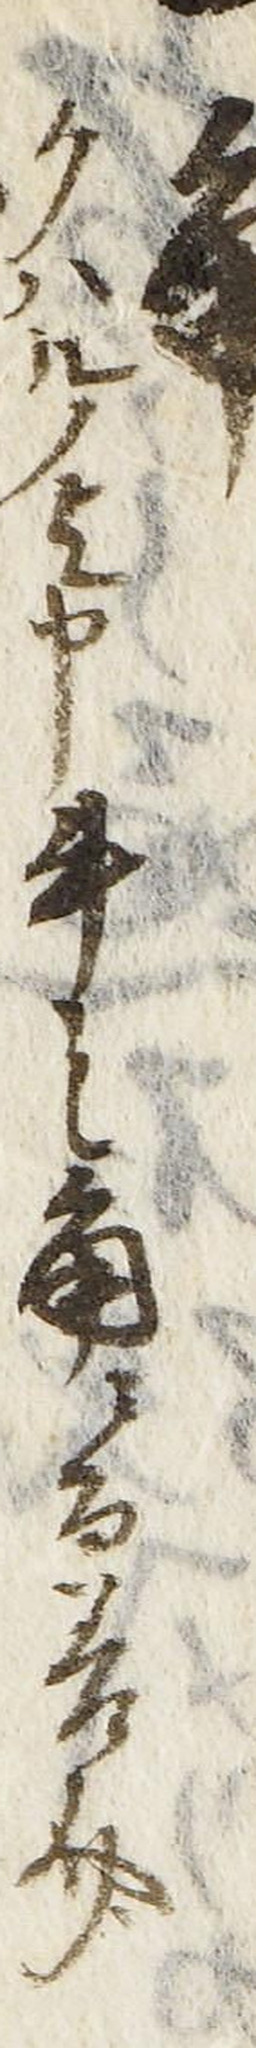ケハルノと申牛之角ニ而善介
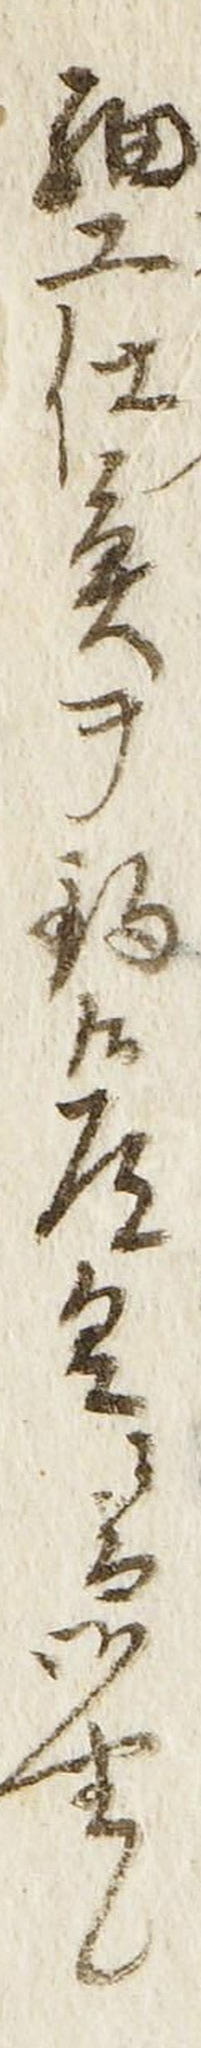細工仕𩵋ヲ釣候道具ニ而御座候
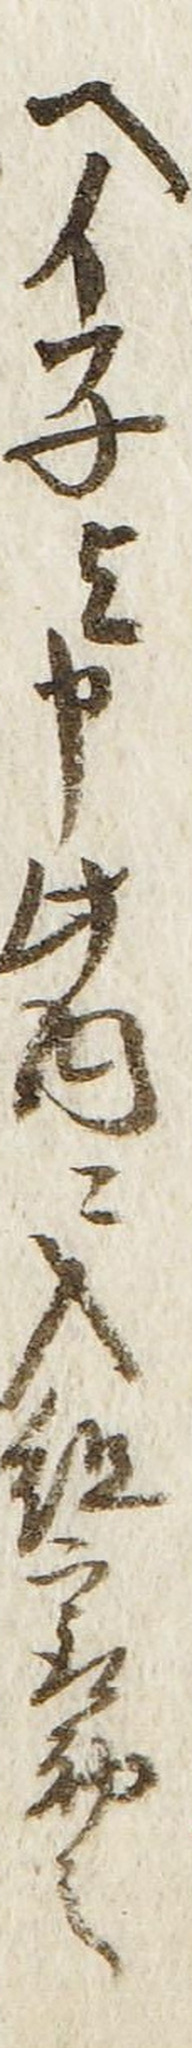へイ子と申此内ニ入組最初之
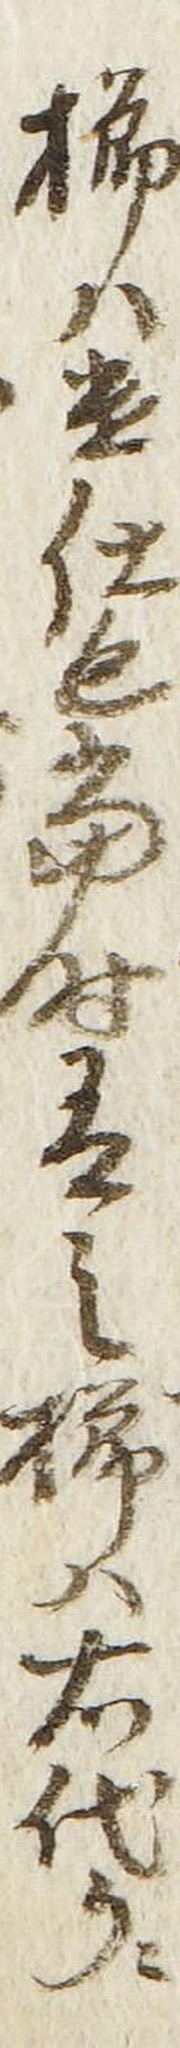櫛ハ遣仕廻當時有之櫛ハ右代りニ
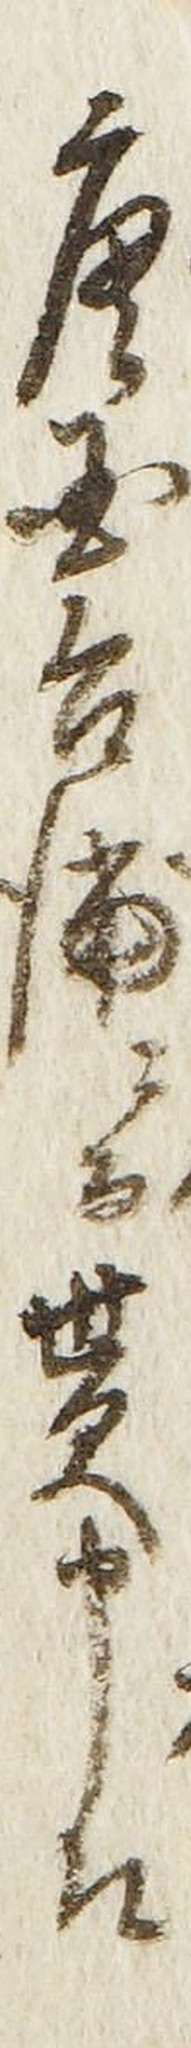唐国乍浦ニ而貰申候
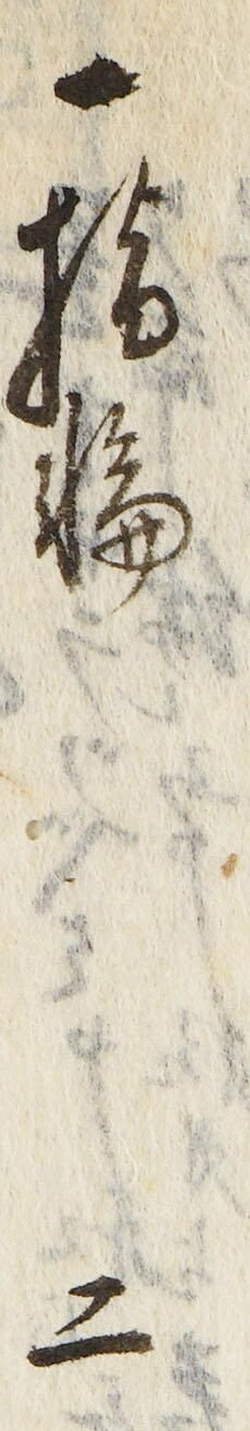一指輪二
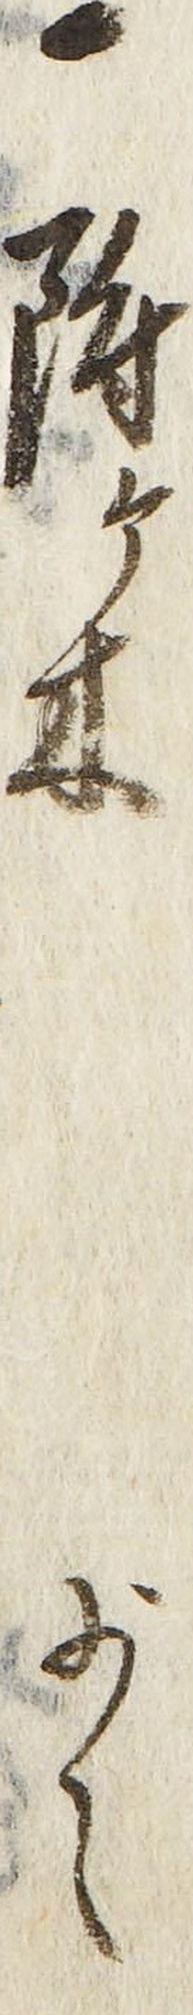一附ケ木少々
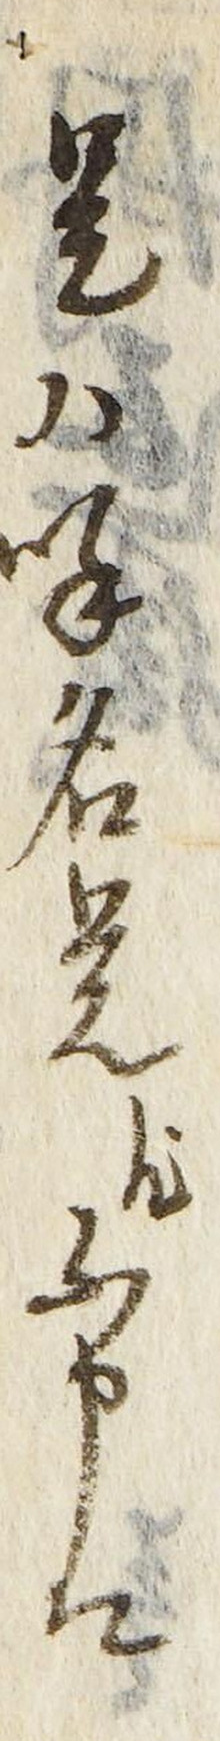是ハ呼名覚江不申を候
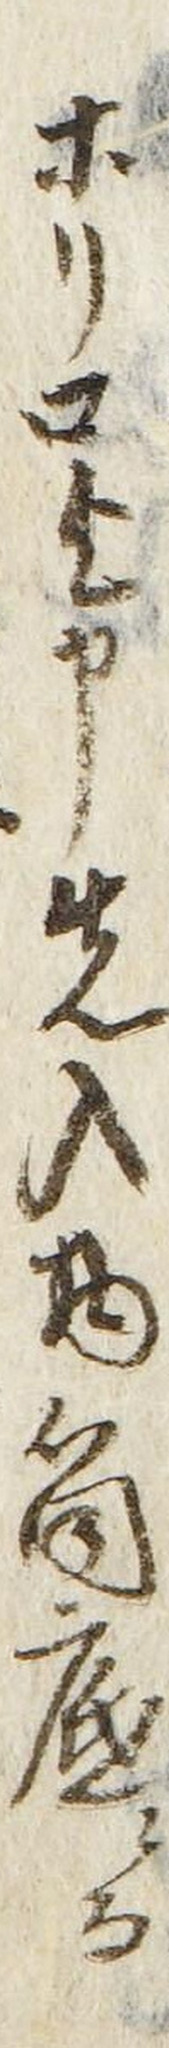ホリロと申先入物筒底ニ而
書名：漂流人善助聞書
